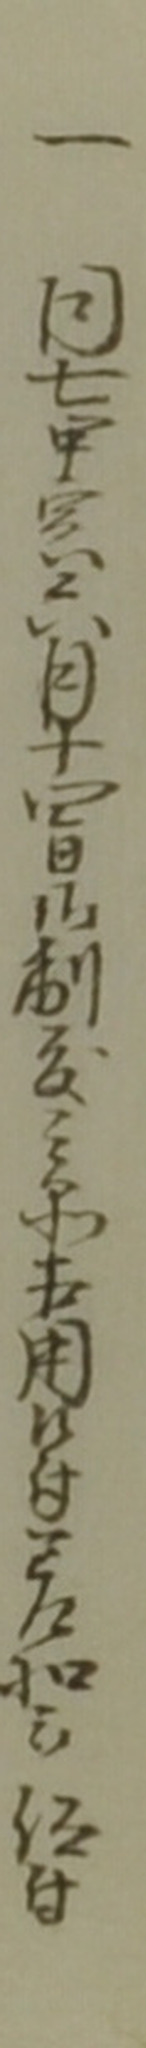一同七甲寅六月十四日御制度之品相用候付差控被仰付

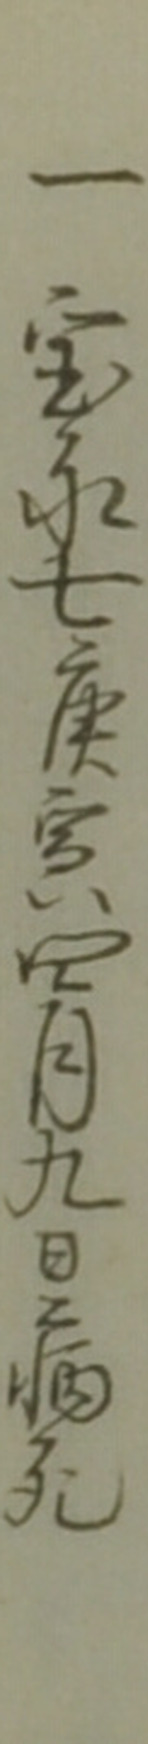一宝永七庚寅四月九日病死

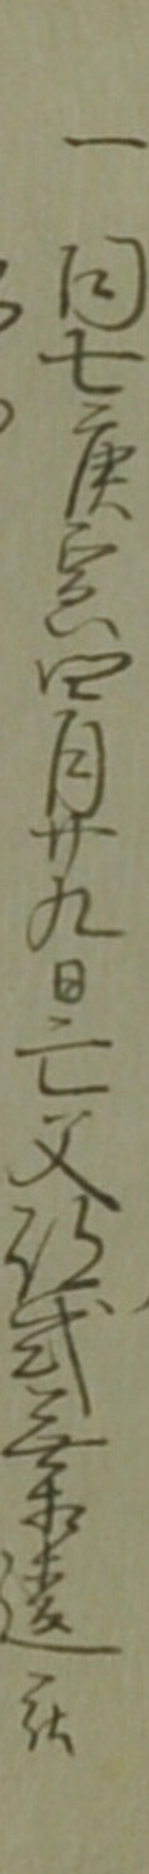一同七庚寅四月廿九日亡父跡式無相違被
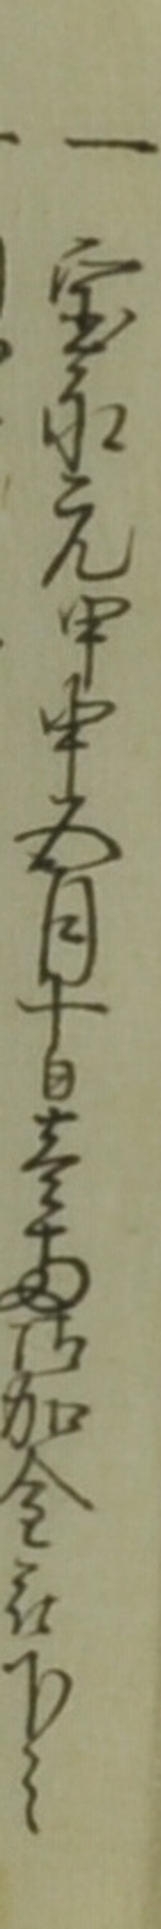一宝永元甲申五月十日壱両御加金被下之
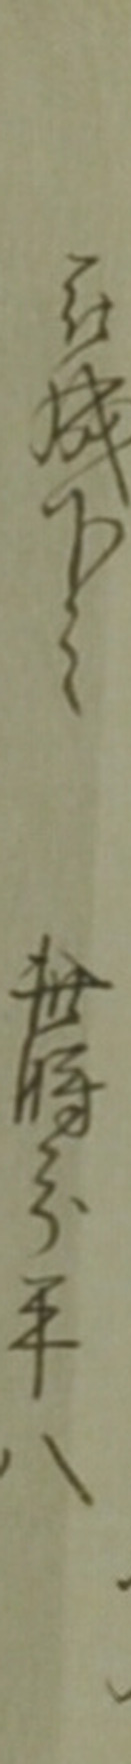被成下之此時分平八
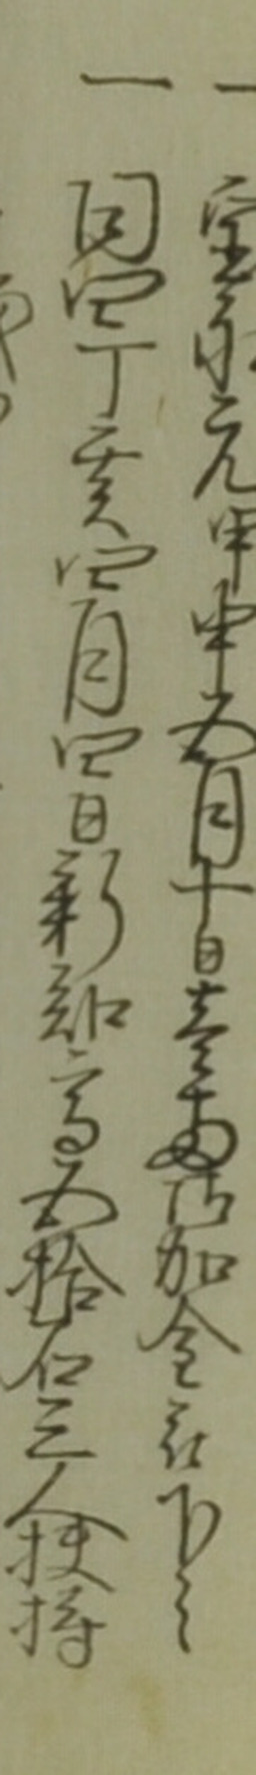一同四丁亥四月四日新知高五拾石三人扶持
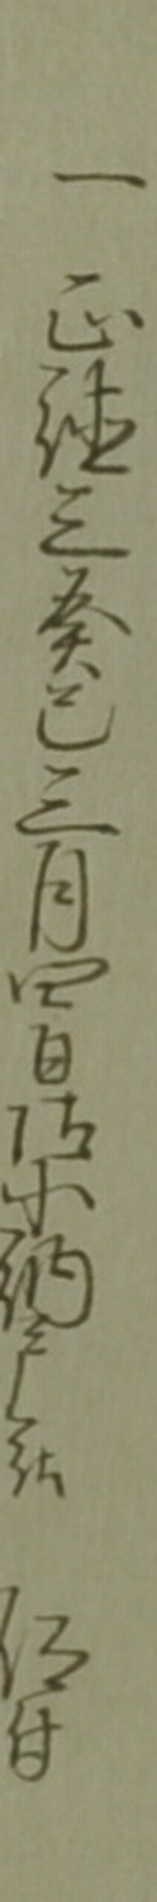一正徳三癸巳三月四日御小納戸被仰付
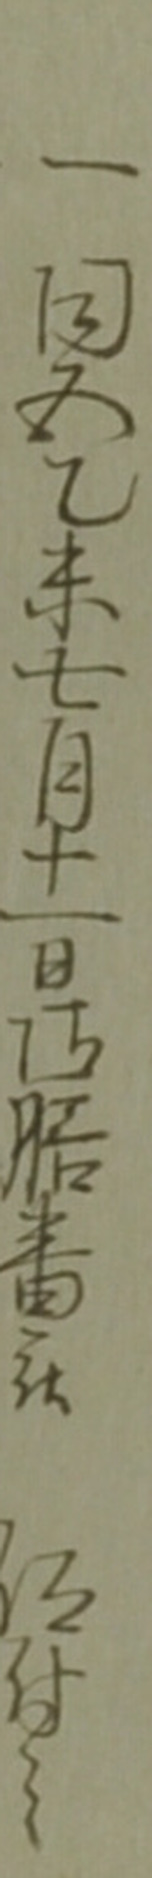一同五乙未七月十一日御膳番被仰付之
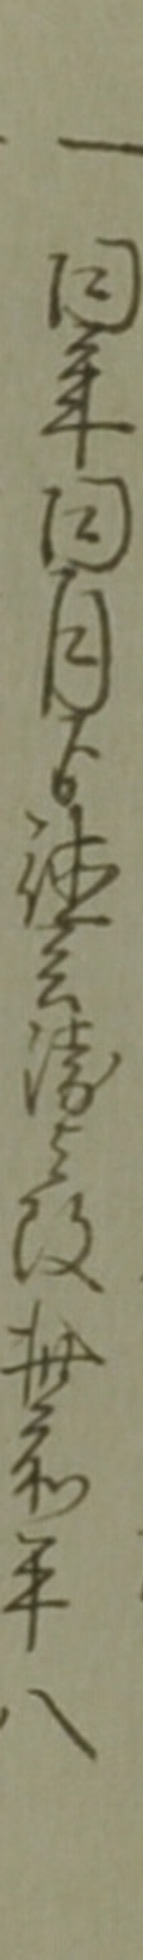一同年同月ゟ徳兵衛与改此前平八
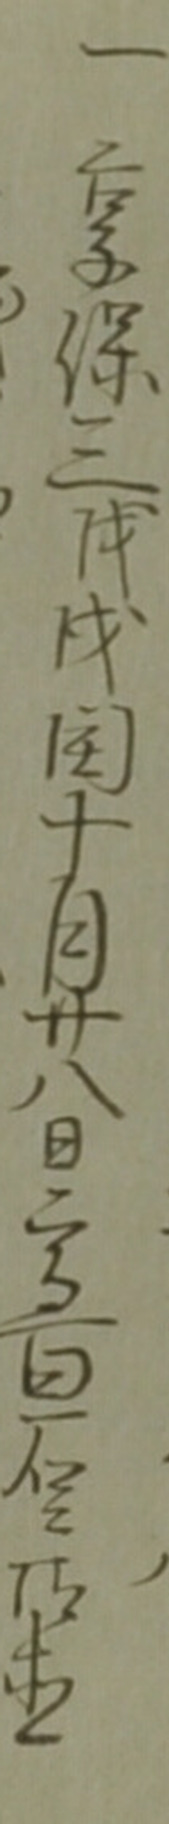一享保三戊戌閏十月廿八日高百石ニ御直
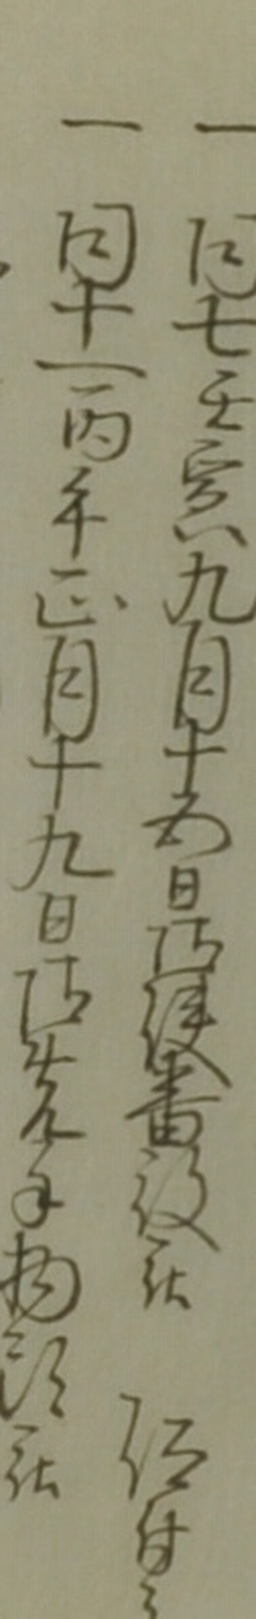一同十一丙午正月十九日御先手物頭被
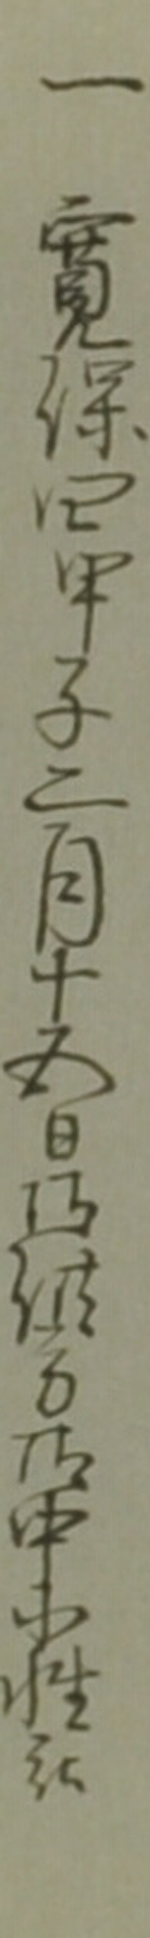一寛保四甲子二月十五日御供方御中小性被
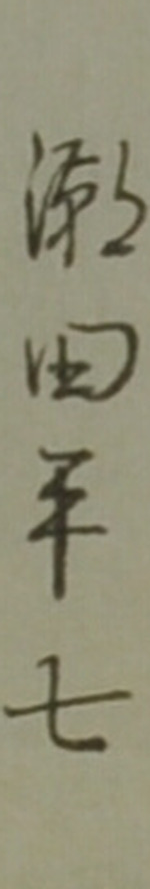潮田平七
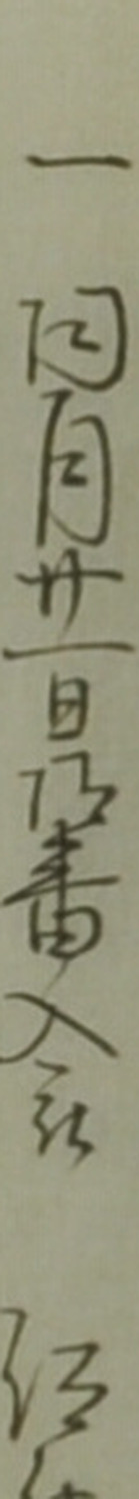一同月廿一日御番入被仰付
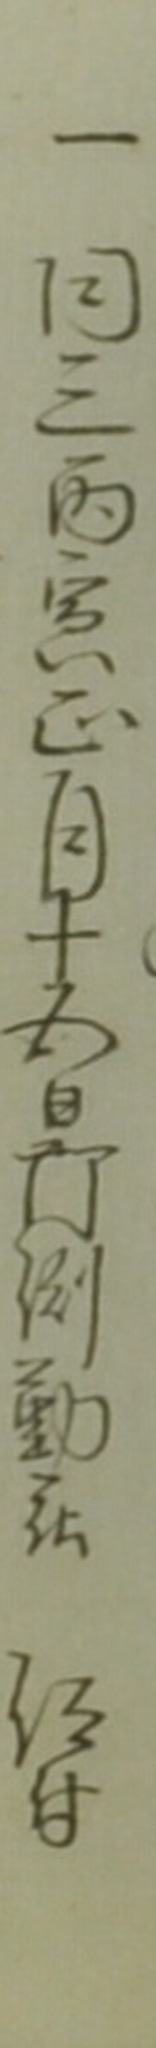一同三丙寅正月十五日御側勤被仰付
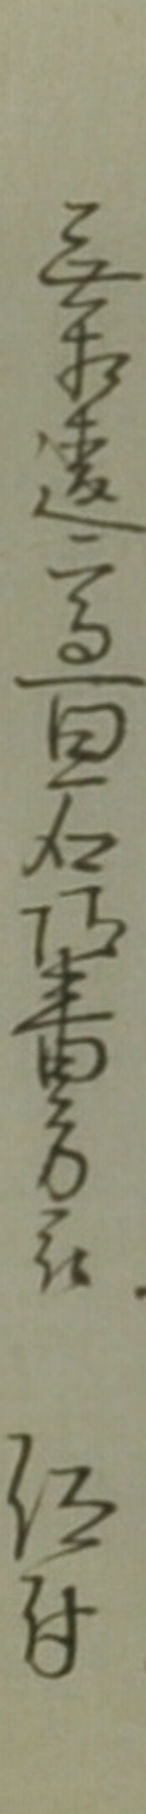無相違高百石御番方被仰付
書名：給人諸士勤仕録（三）
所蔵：伊那市立高遠町図書館・合同会社AMANE
